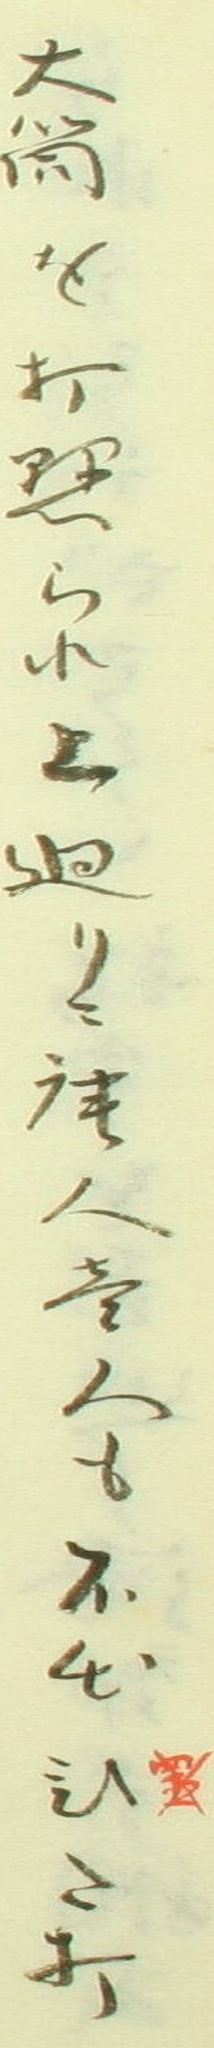大筒を打懸られ上廻りに唐人壱人も不出ひた打
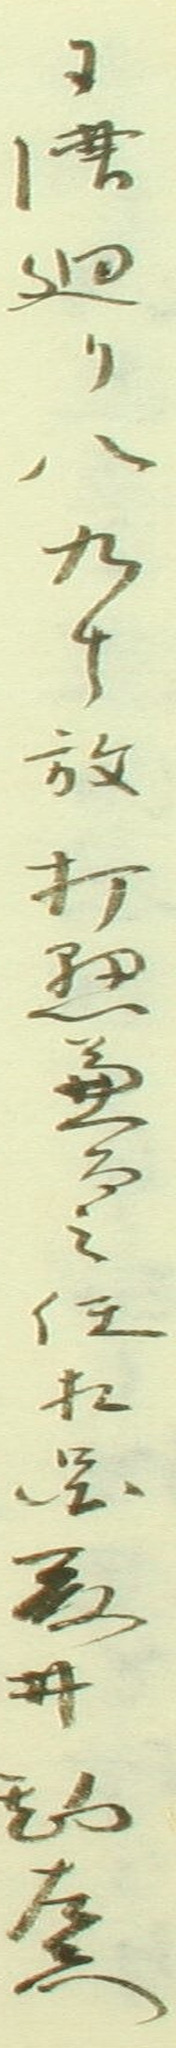に漕廻り八九十放懸兼而之任相図藤井勘左衛門
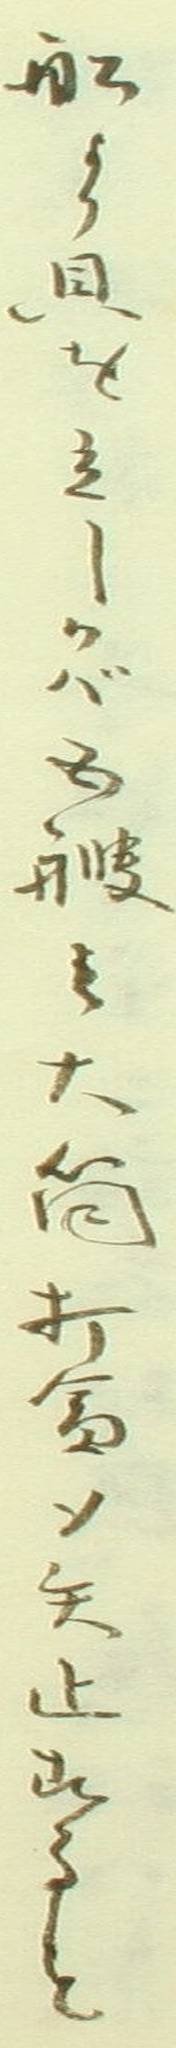船より具を立しかば五艘も大筒打とめ矢止すると
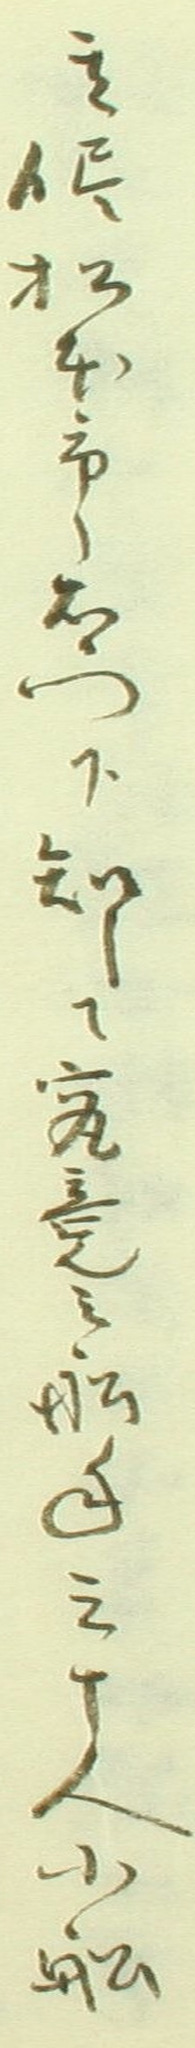其侭松本市郎右衛門下知して容竟之船手之十人小船
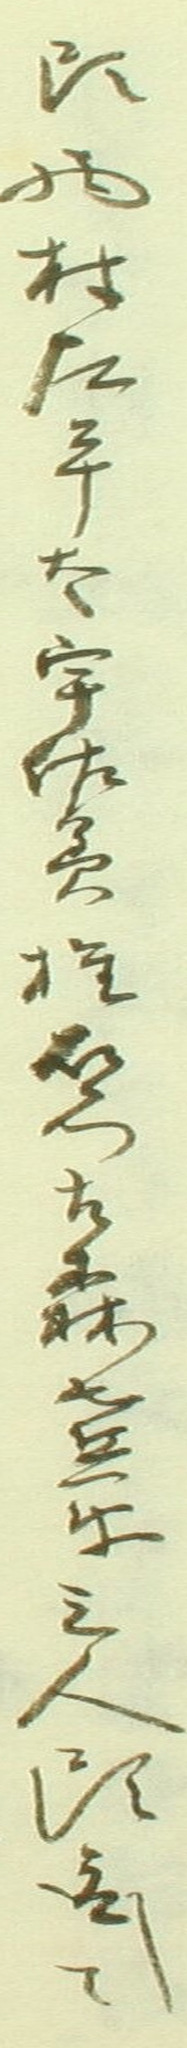頭西村左平太宇佐美権右衛門古森七兵衛三人頭とる取して
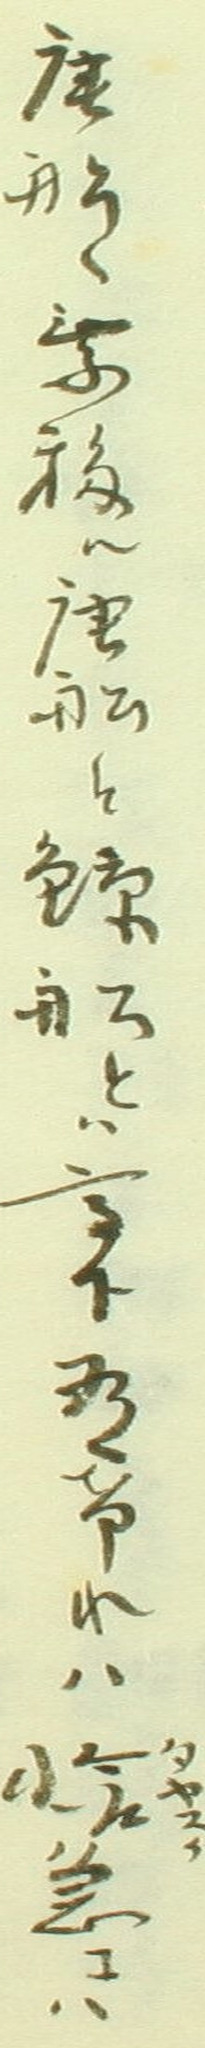唐船へ乗移る唐船は鯨船とは高下有けれは輙急には
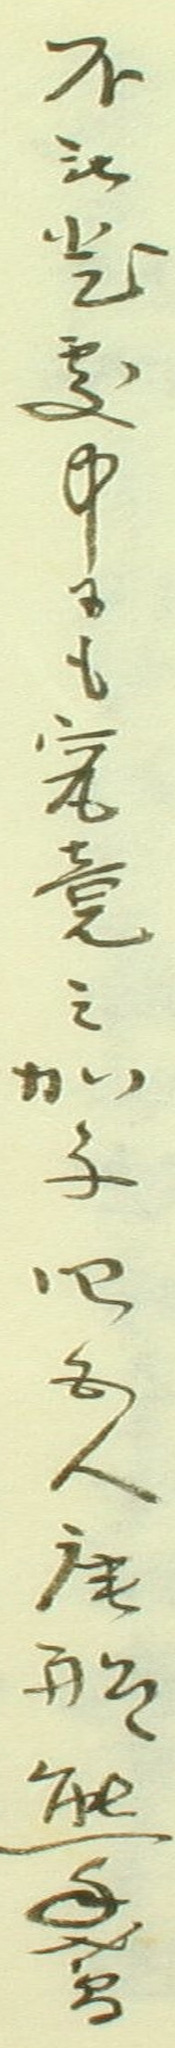不被登處中にも容竟の加子四五人唐船へ熊手鳶
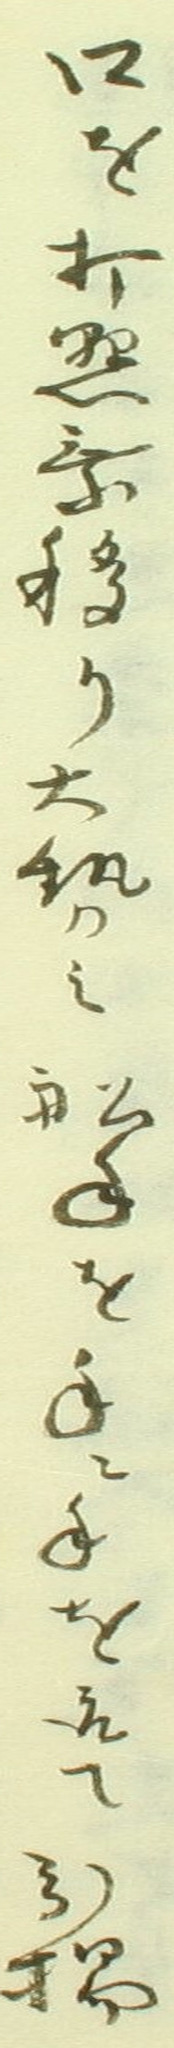口を打懸乗移り大勢の船手を手に手を取りて引揚
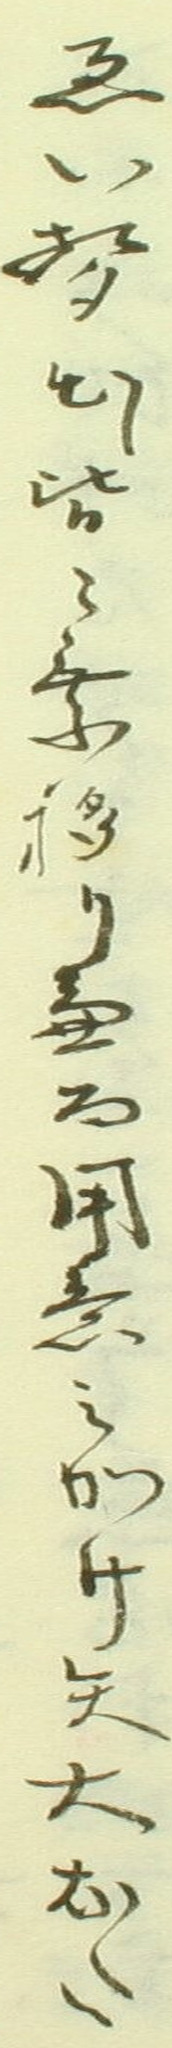ゑい？出し皆々乗移り兼而用意之加け矢大なた
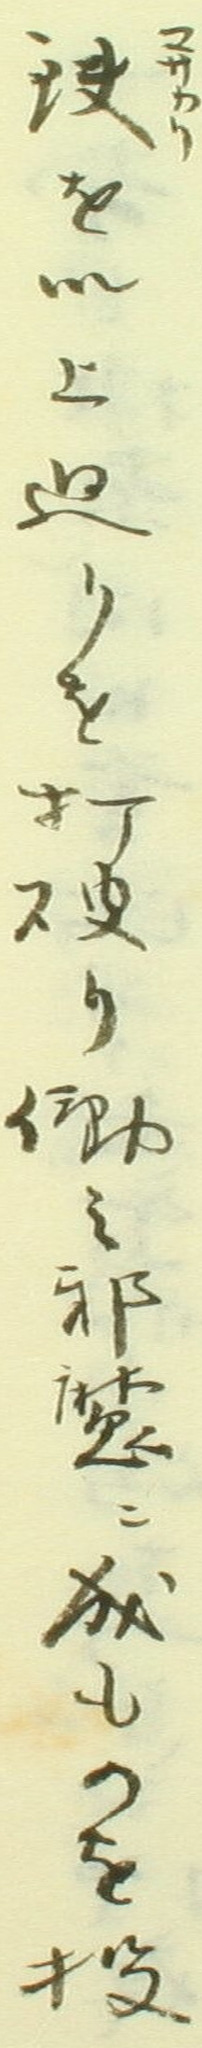鉞を以上廻りを打破り働之邪魔に成ものを投
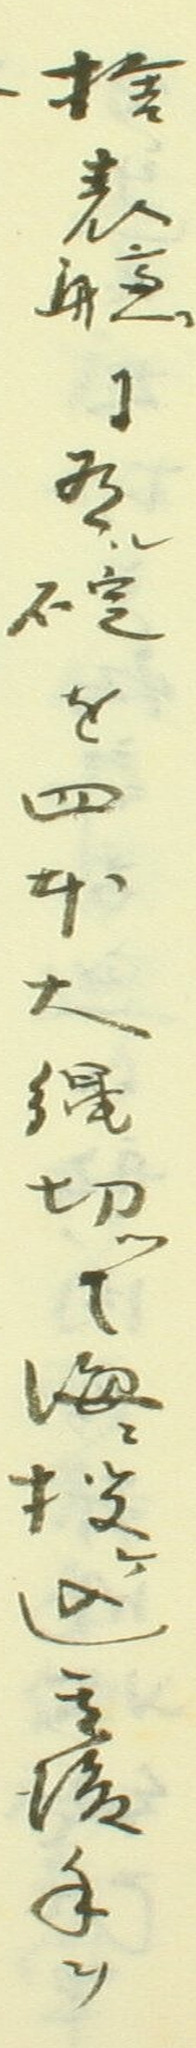捨表舷に有る碇を四本大綱切って海に投け込其後手を
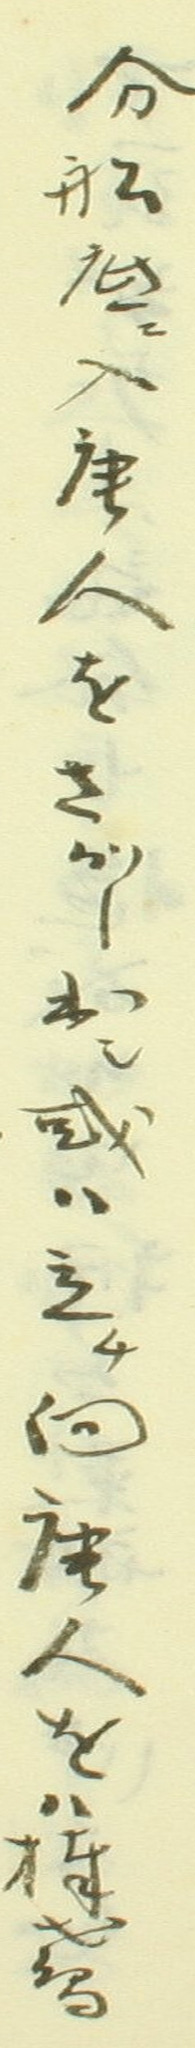分船底に入唐人をさがし出し或は立ち向唐人をは棒鳶
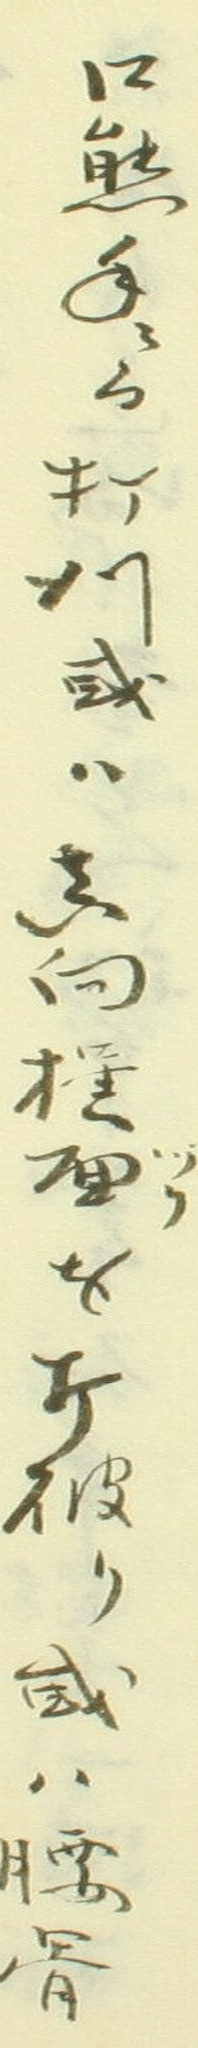口熊手に而打刈或は真向横面を打被り或は腰骨
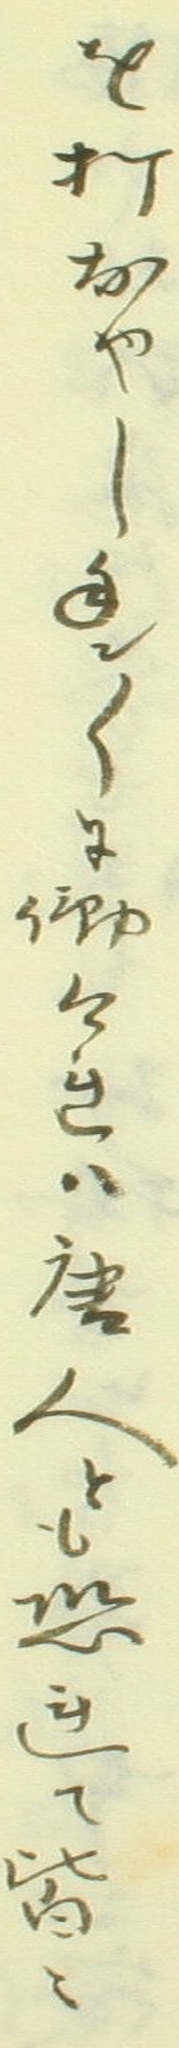を打なやし手に手に働けれは唐人とも恐れて皆皆
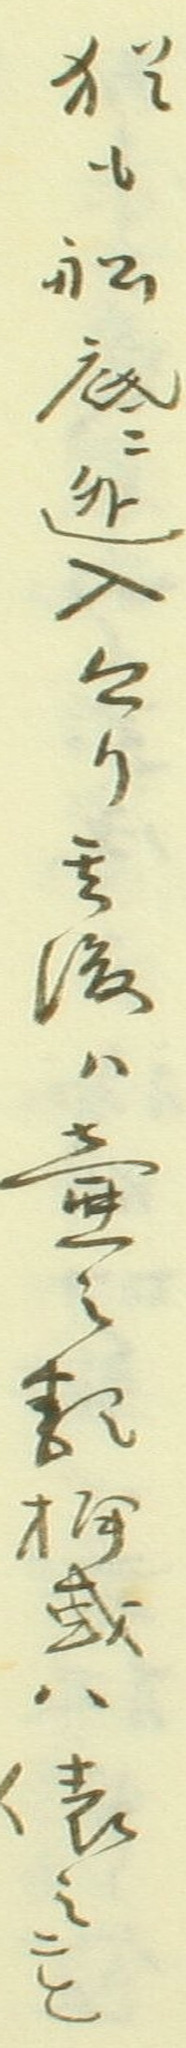猶も船底に逃入けり其後は壺之類押或は俵之こと
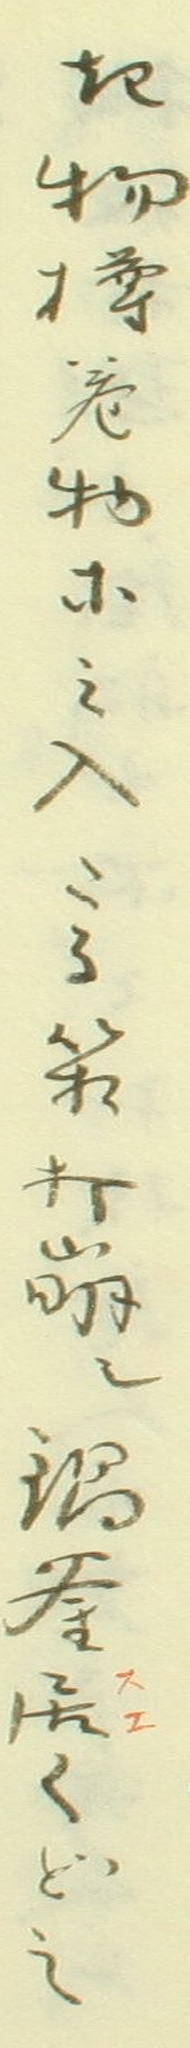起物樽巻物等之入たる箱打崩し鍋釜居くど之
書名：唐船漂流記 三
